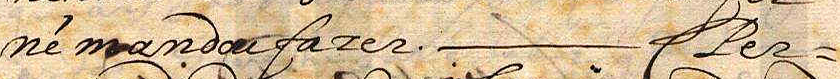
nē mandou fazer. - Per
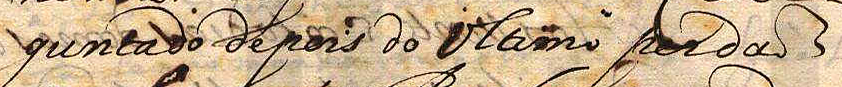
guntado depois do vltimo perdaõ
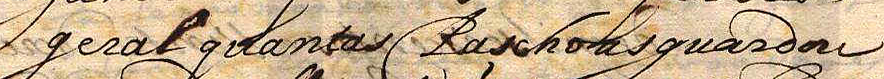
geral quantas Paschoas guardou
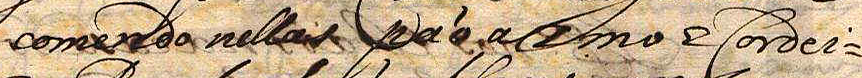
comendo nellas paõ azmo E Cordei
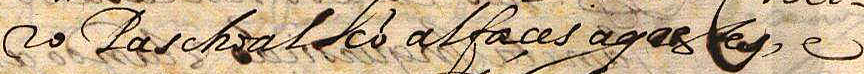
ro Paschoal cō alfaçes agrestes, e
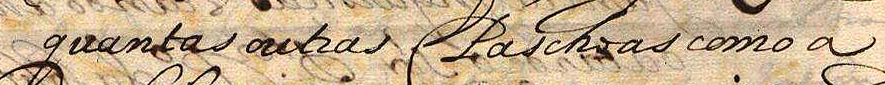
quantas outras Paschoas como a
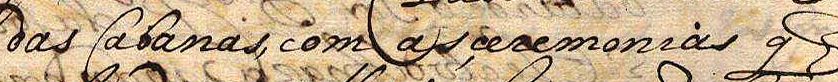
das Cabanas, com as çeremonias q̄
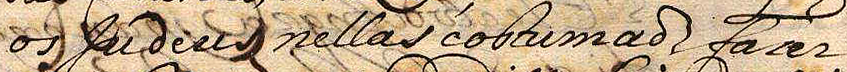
os Judeus nellas costumaõ fazer
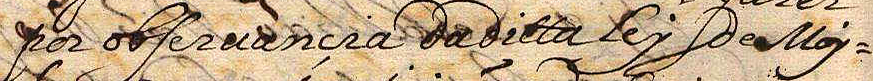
por obseruançia da ditta Ley de Moy
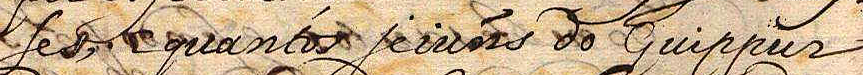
ses, E quantos jeiun̄s do Quippur
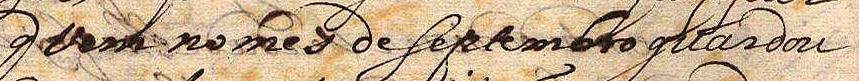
q̄ vem no mes de septembro guardou
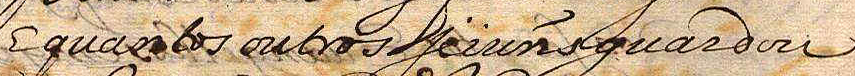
E quantos outros jeiun̄s guardou
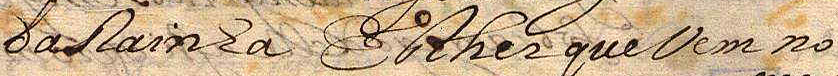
da Rainha Esther que Vem no
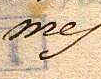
mes
